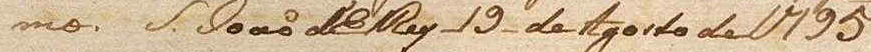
mo. S. Ioaõ d´El Rey - 19 - de Agosto de 1795
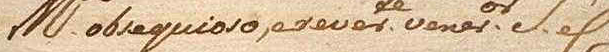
M.to obsequioso, e rever.te vener.or S. e C.
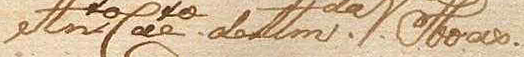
An.to Cae.to de Alm.da V.asboas.
